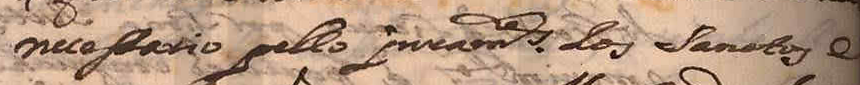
necessario pello juram.to dos Sanctos E
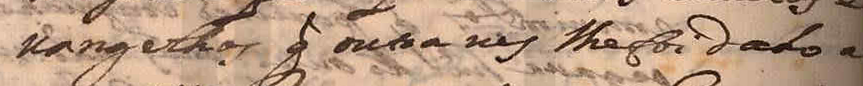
uangelhos q̄ outra ues lhe foi dado a
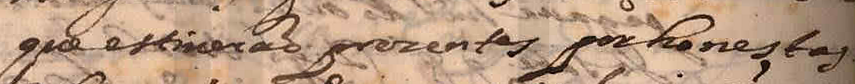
que estiueraõ prezentes por honestas
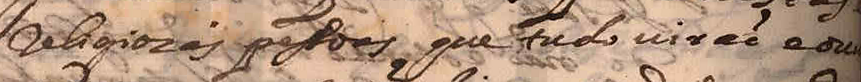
Religiozas pessoas que tudo uiraõ e ouu
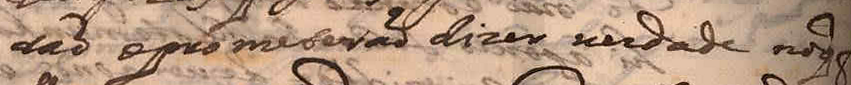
rão e prometeraõ dizer uerdade no q̄ f
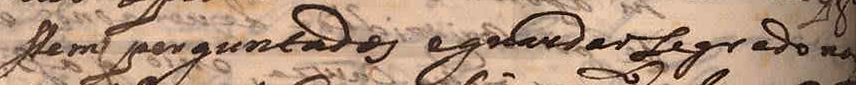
ssem perguntados e guardar segredo no
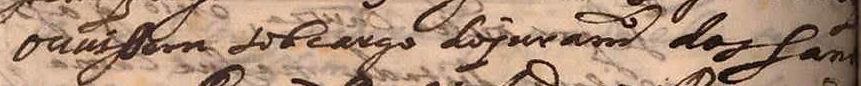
ouuissem sob cargo do juramto dos san
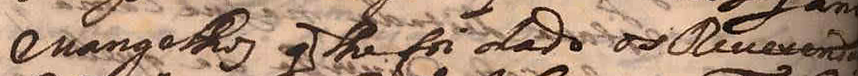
euangelhos q̄ lhe foi dado os Reuerendo
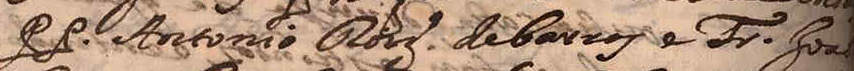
PP. Antonio Roiz̄ de barros, e Fr. Joaõ
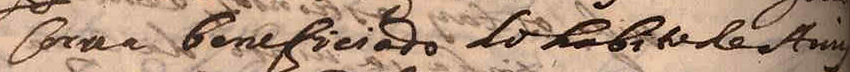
Correa beneficiado do habito de Auis
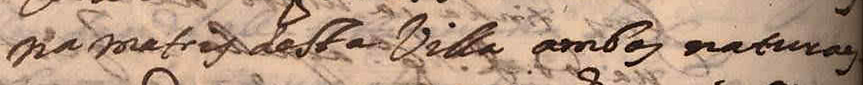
na matris desta Villa ambos naturaes
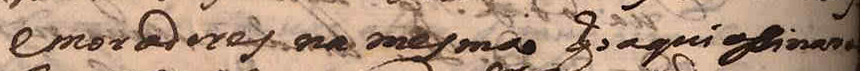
e moradores na mesma q̄ aqui assinara
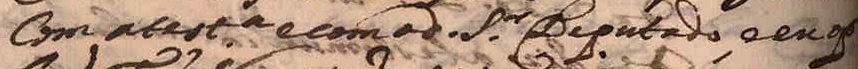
Com a test.a e com o d. S.r Deputado, e eu o p
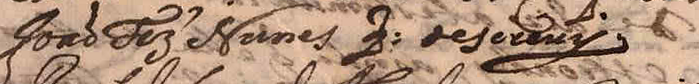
Joaõ Fez̄ Nunes q̄ o escreuy
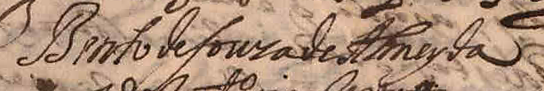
Bento de Souza de Almeyda
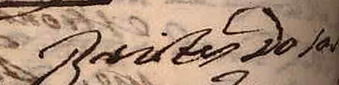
Brites do sa
